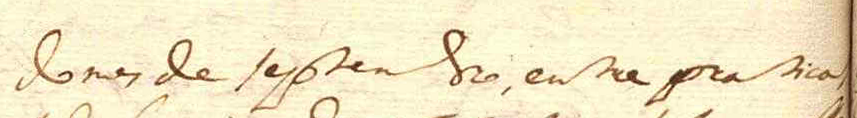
do mes de septenbro, entre praticas
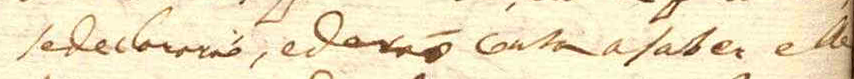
se declararaõ, e deraõ conta a saber elle
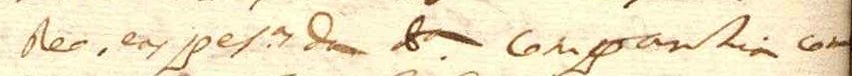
Reo, e as pes.as da d̄a. companhia com
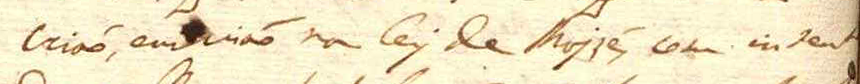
Criaõ, e uiuiaõ na ley de Mojzés com intent
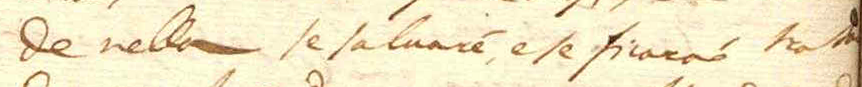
de nella se saluarē, e se ficaraõ trata
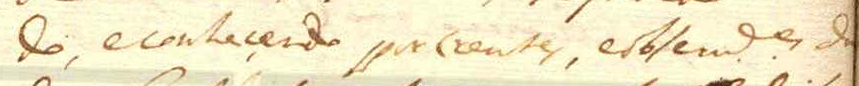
do, e conhecendo por crentes, e obseru.tes da
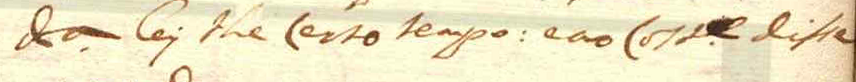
da. lej the certo tempo: e ao Cost.e disse
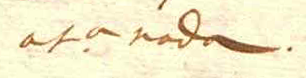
a t.a nada.
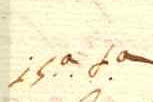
i5.a t.a
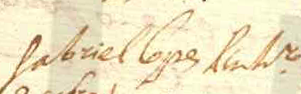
gabriel lopes Pinh.ro
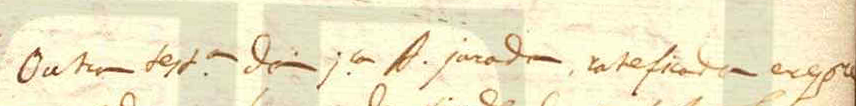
Outra test.a da j.ça A. jurada, rateficada e repre
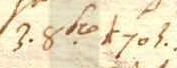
3. 8.bro d̄ 703.
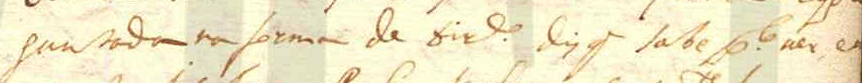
guntada na forma de dir.to dis q̄ sabe p.lo uer e
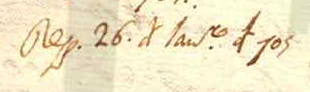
Rep. 26. d̄ Ian.ro d̄ 705
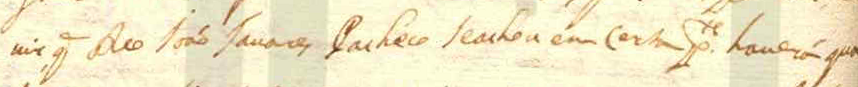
uir q̄ Reo Ioaõ Tauares Pacheco se achou em certa pte. hauera qua
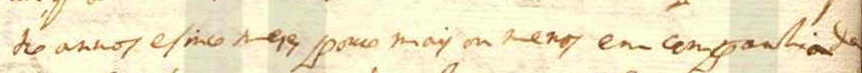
tro annos e sinco meses pouco mais ou menos em companhia de
